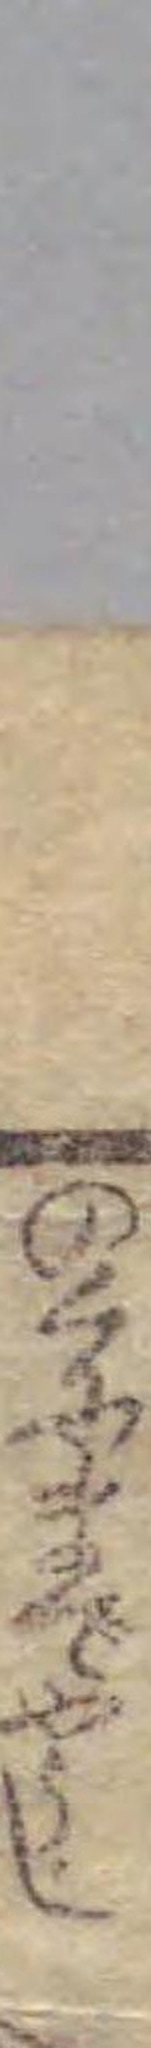のくにまでやうじ
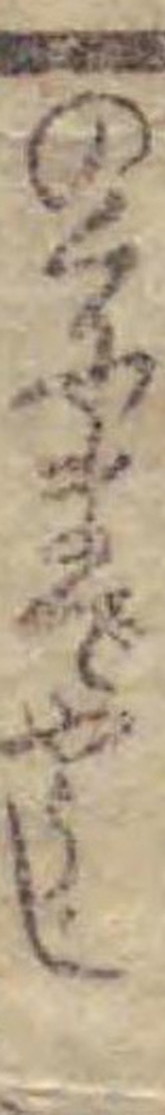のくにまでやうじ
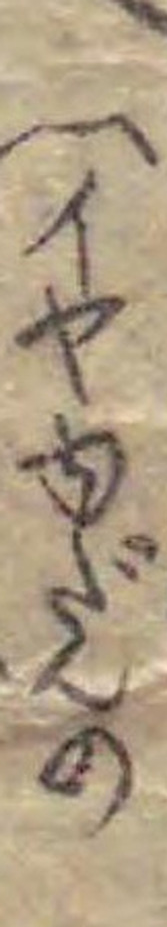〽イヤゆだんの
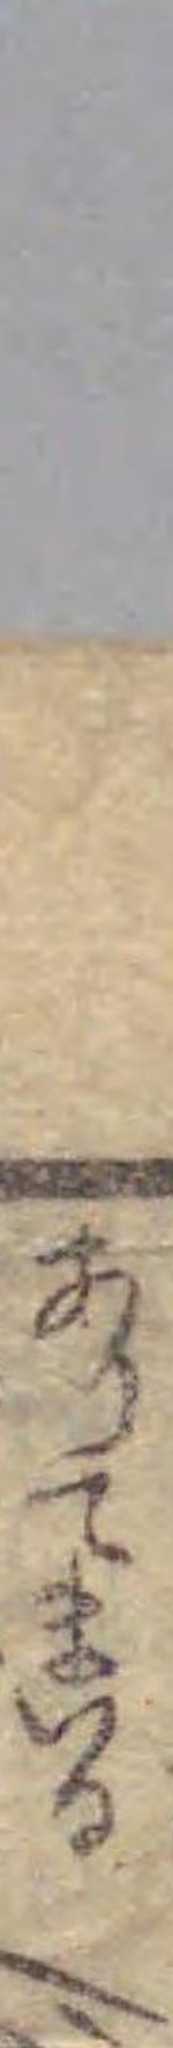ありてまいる
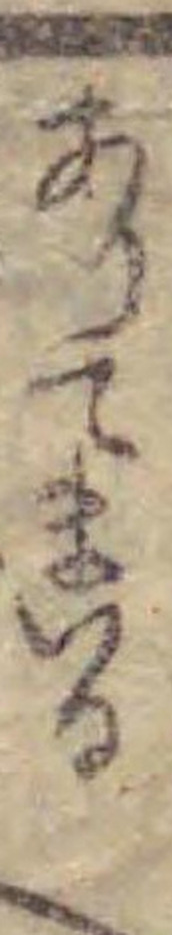ありてまいる
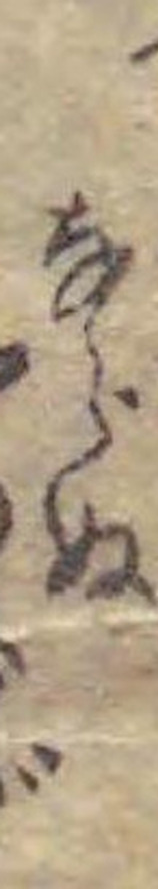ならぬ
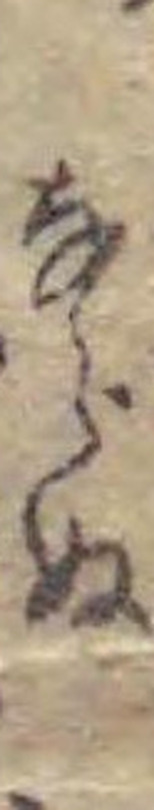ならぬ
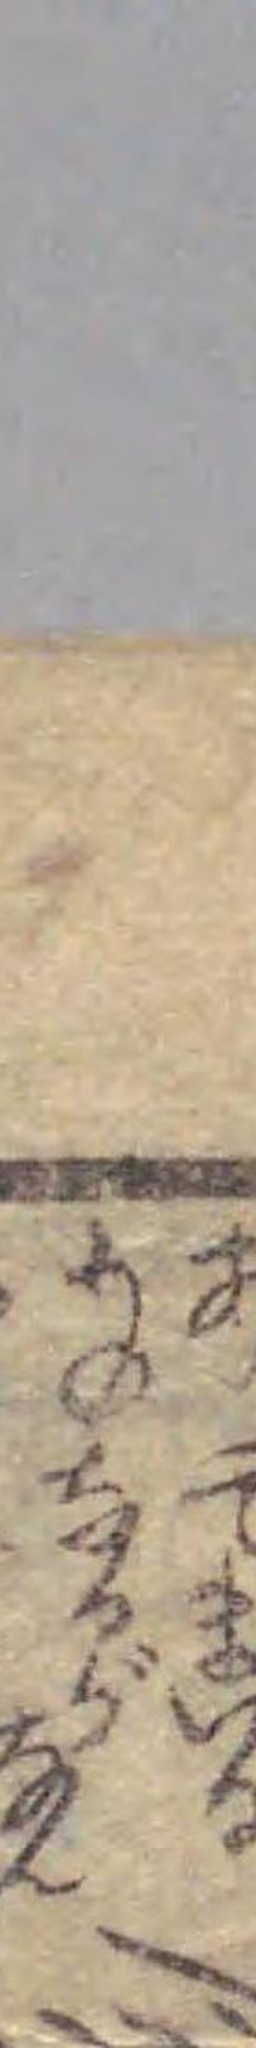ものなるがなん
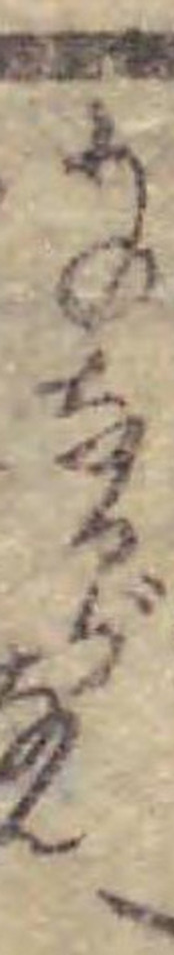ものなるがなん
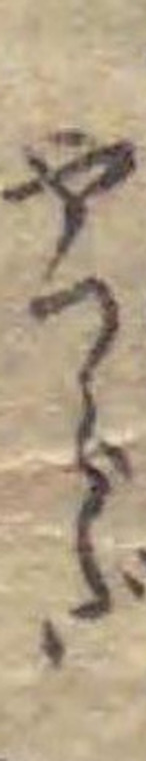やつらだ
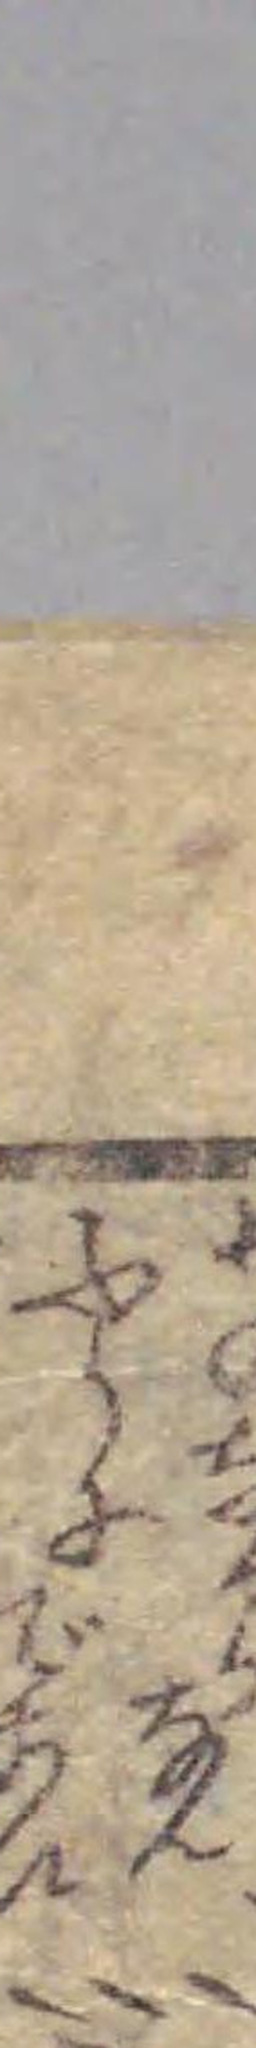ふうにであい
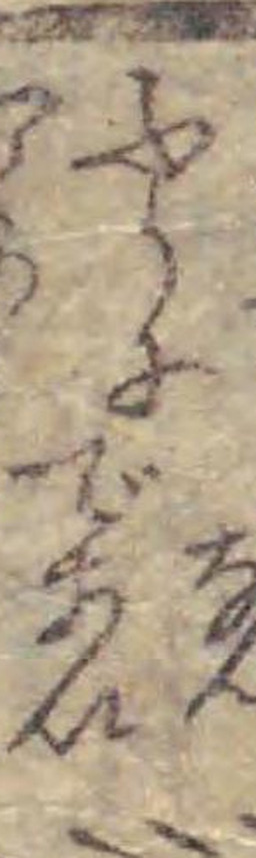ふうにであい
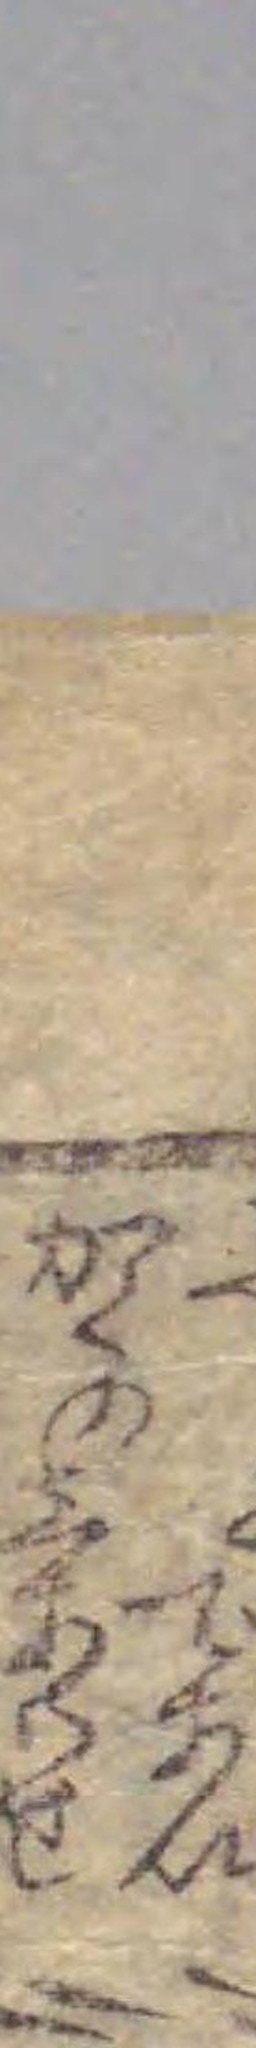かくのしあわせ
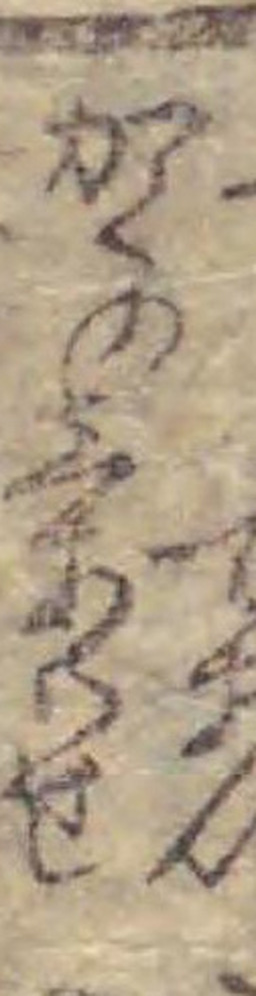かくのしあわせ
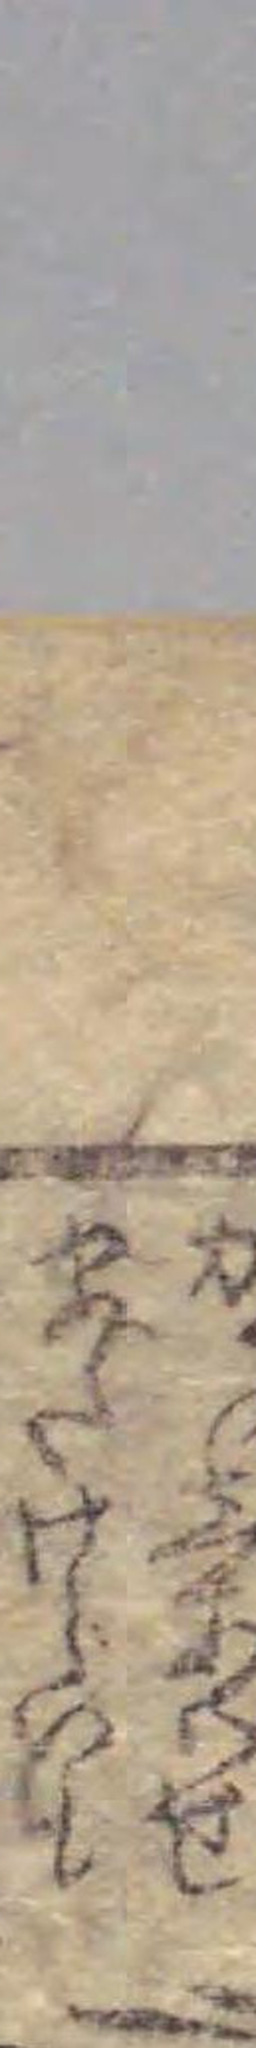またけらいも
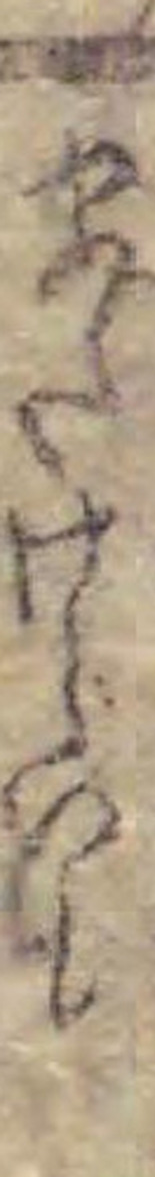またけらいも
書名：化物世界夜半嵐 : 3巻
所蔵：国立国会図書館 National Diet Library, JAPAN
